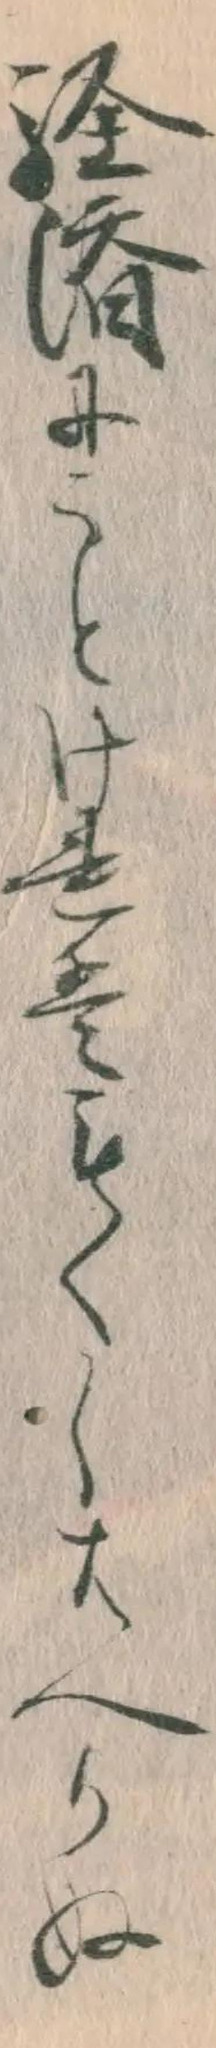経済にうとけれはもくしはへりぬ
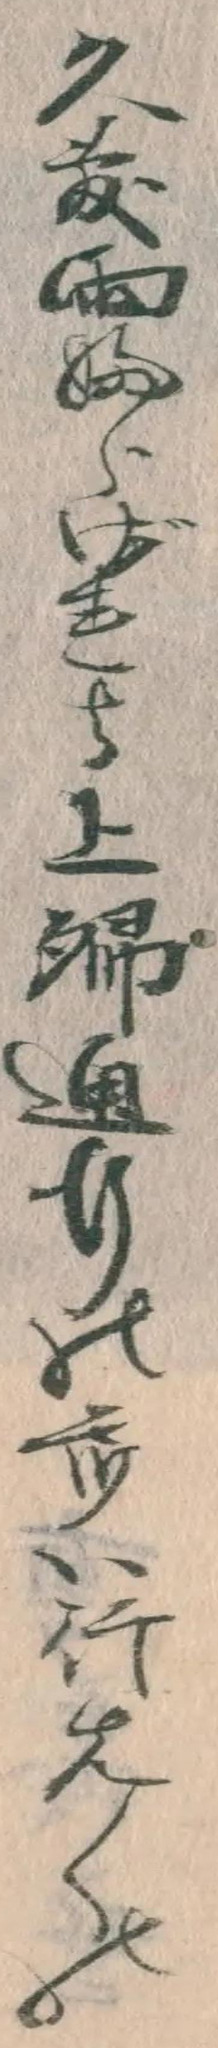久敷雨ふらざれは上郷通行の節は行先〳〵の
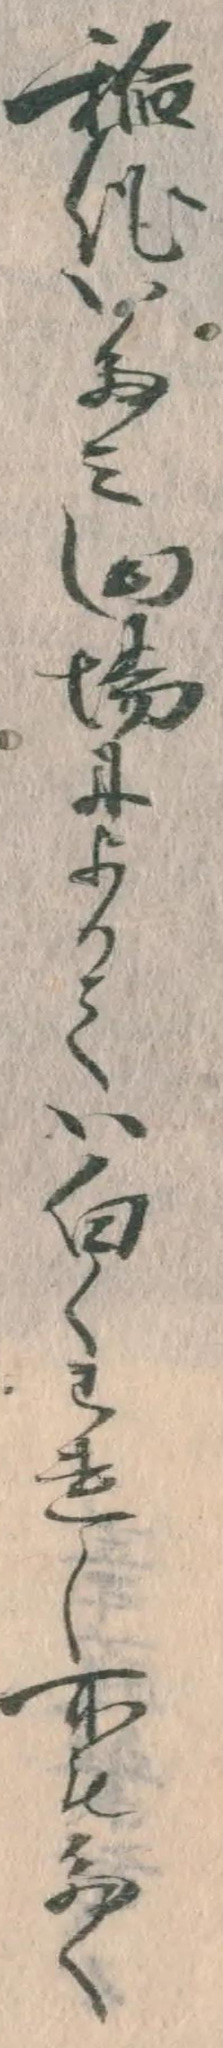稲作いたみ田場によりては白くわれし所も多く
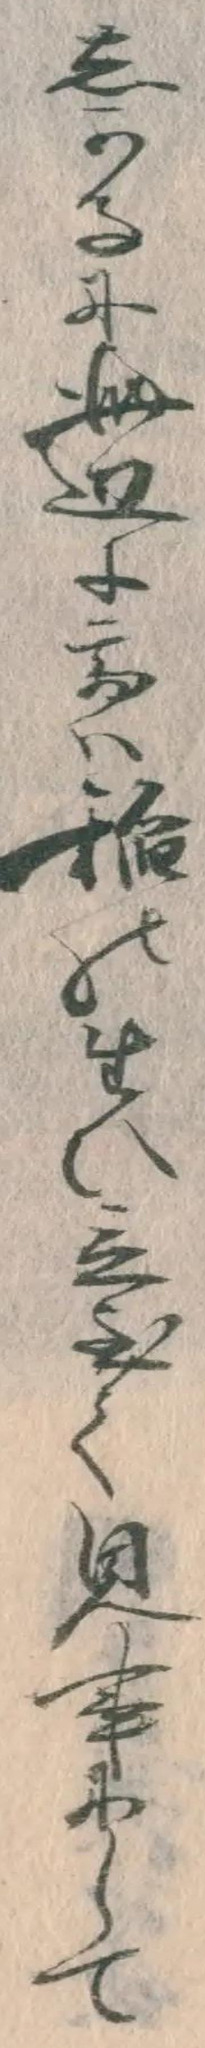しかるに此辺にては稲の生ひ立至て見事にして
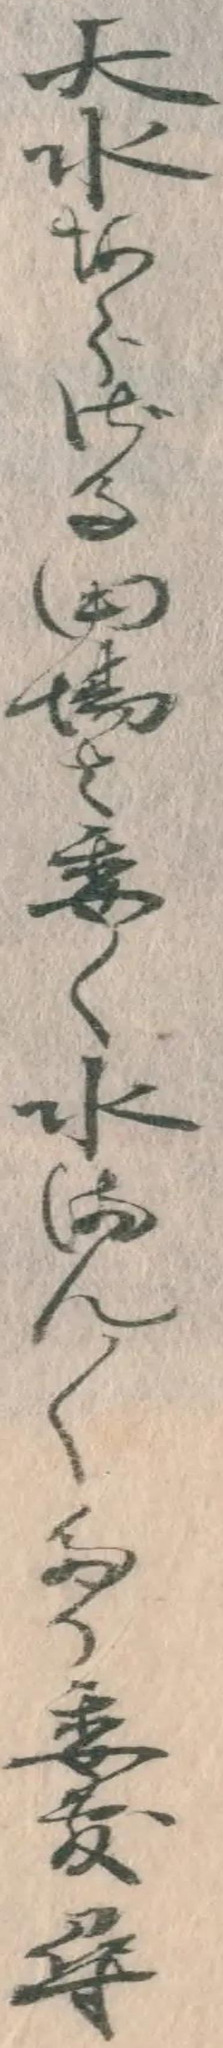大水ならざる田場は悉く水まん〳〵たり委敷尋
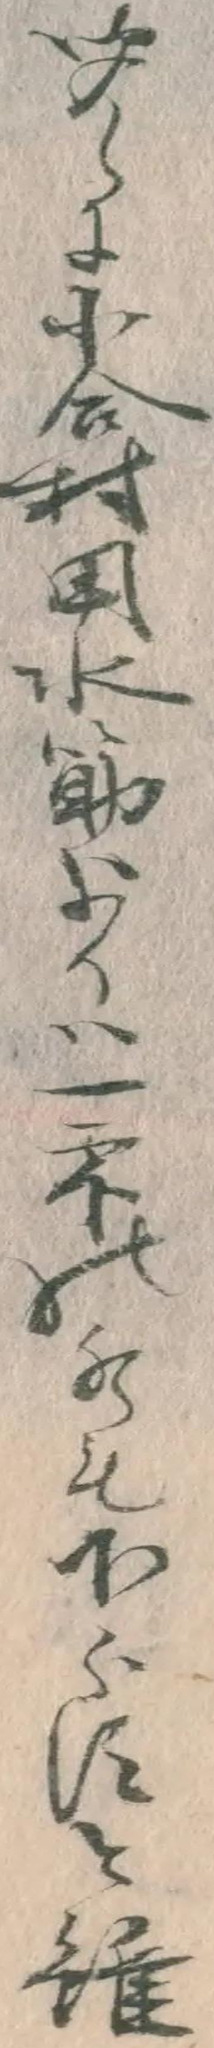聞くに小合村用水筋よりは一雫の水も下らすと雖
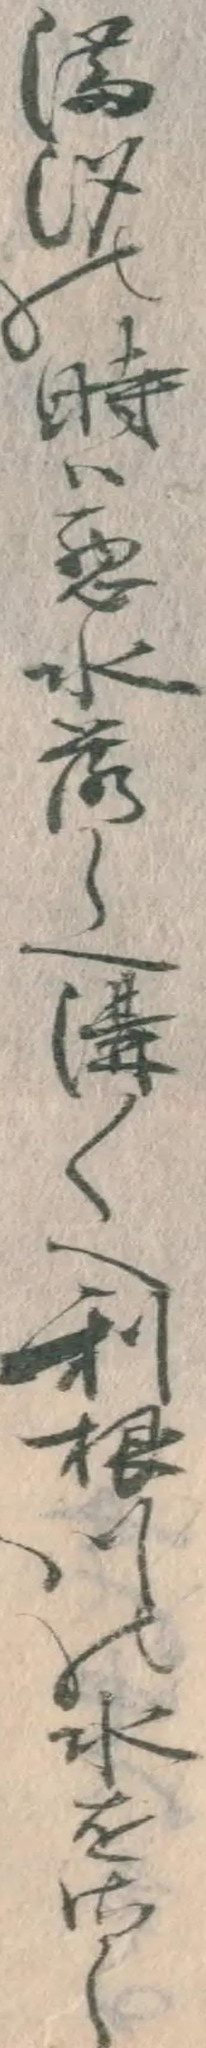満汐の時は悪水落し之溝〳〵へ利根川の水をさし
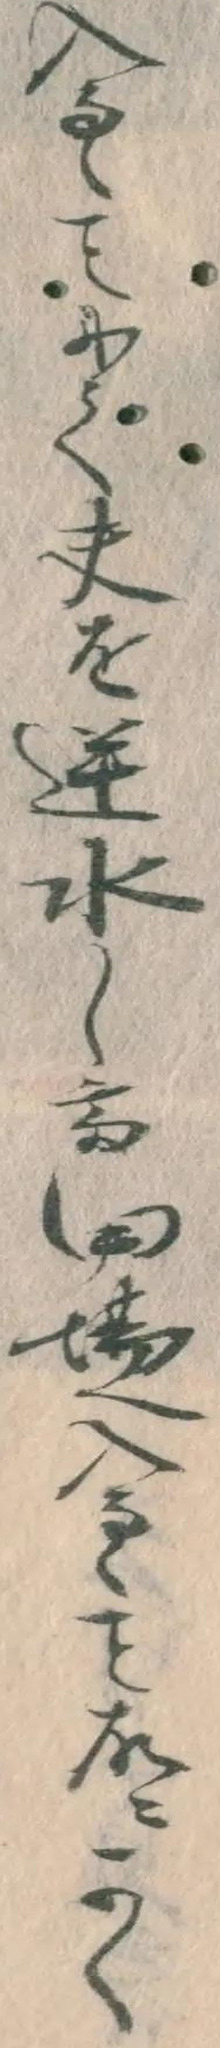入るゝことにて夫を逆水して田場へ入るゝこと故にかく

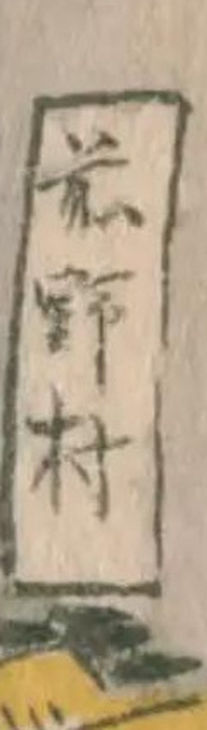前野村
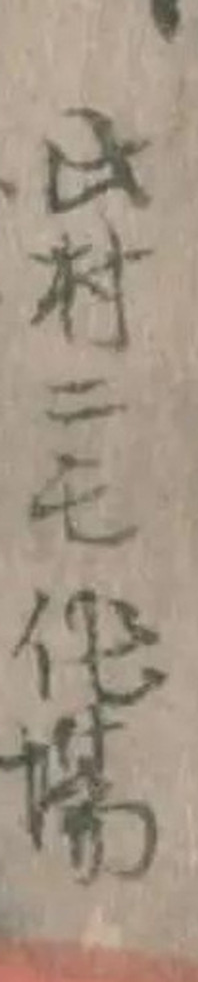此村ニモ作場
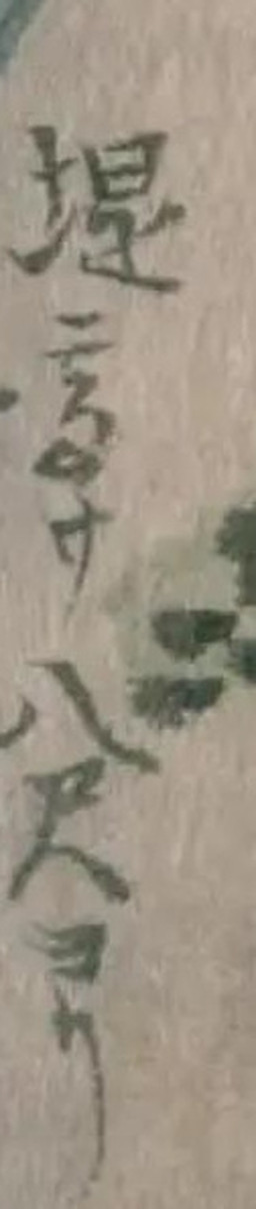堤高サ八尺ヨリ
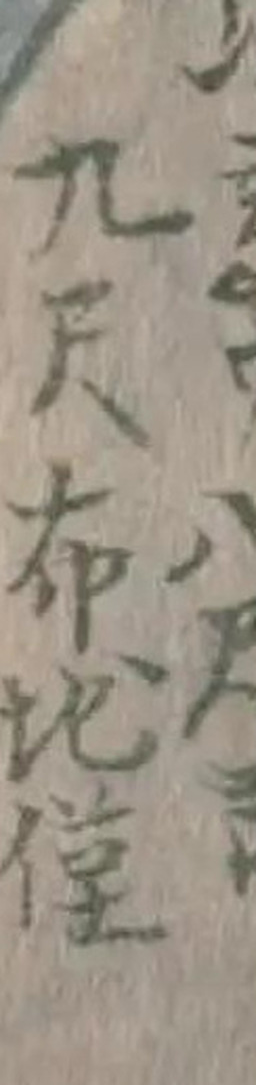九尺布地僅
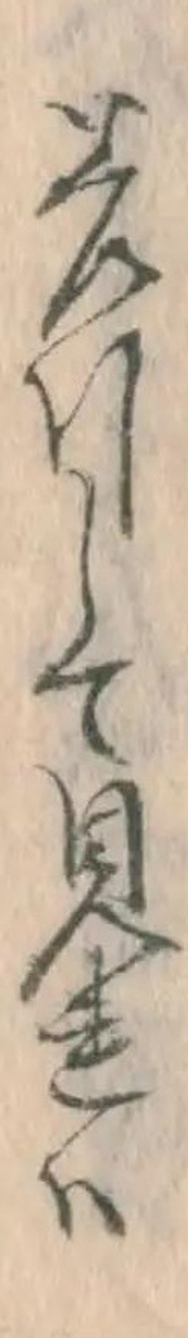差引して見れは
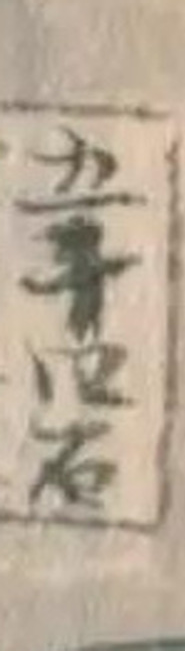五十四石
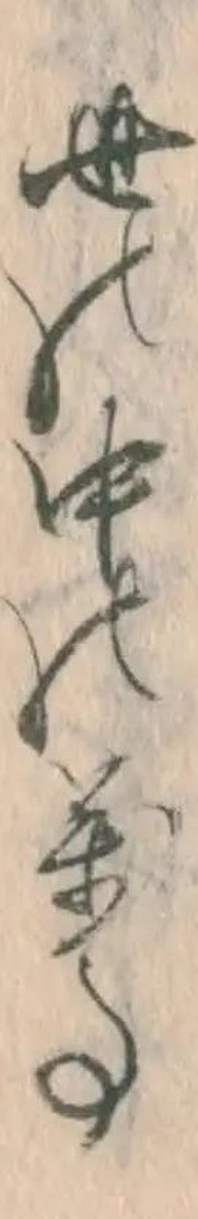世の中の万事
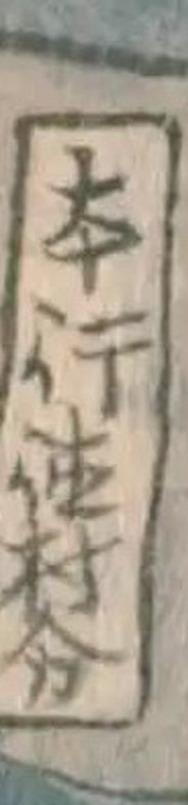本行徳村分
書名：四神地名録 6巻. [4]葛飾郡
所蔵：国立国会図書館 National Diet Library, JAPAN
